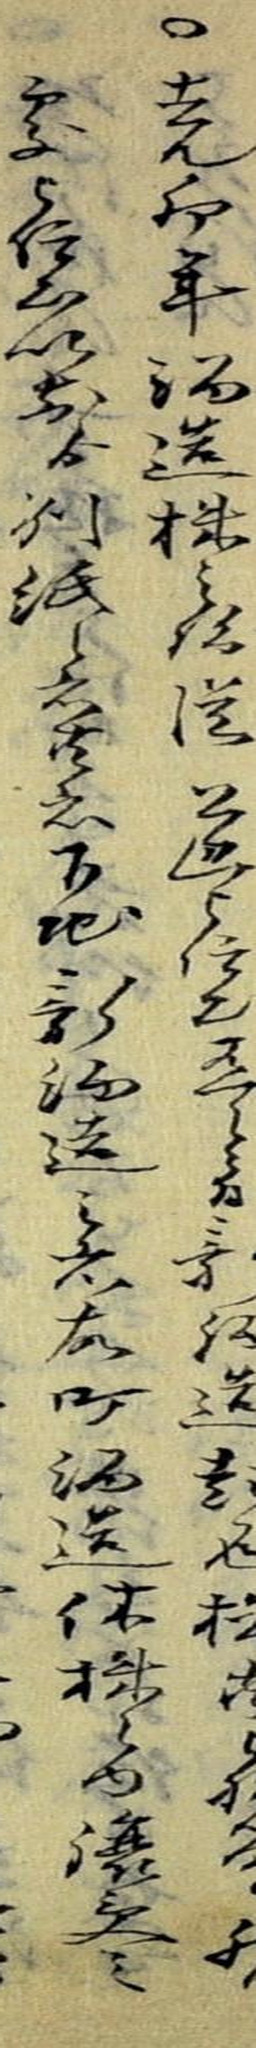処被仰出以前ゟ別紙之者共は下地新酒造之者故町酒造休株之内譲受之
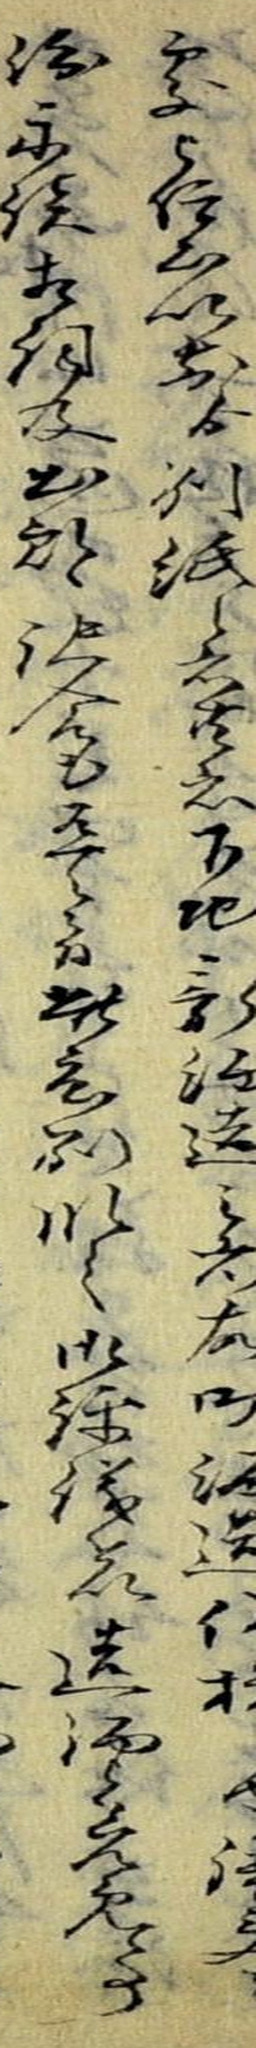儀示談相調及出願候訳合も有之候に付此度別段之御評議を以造酒被差免候事
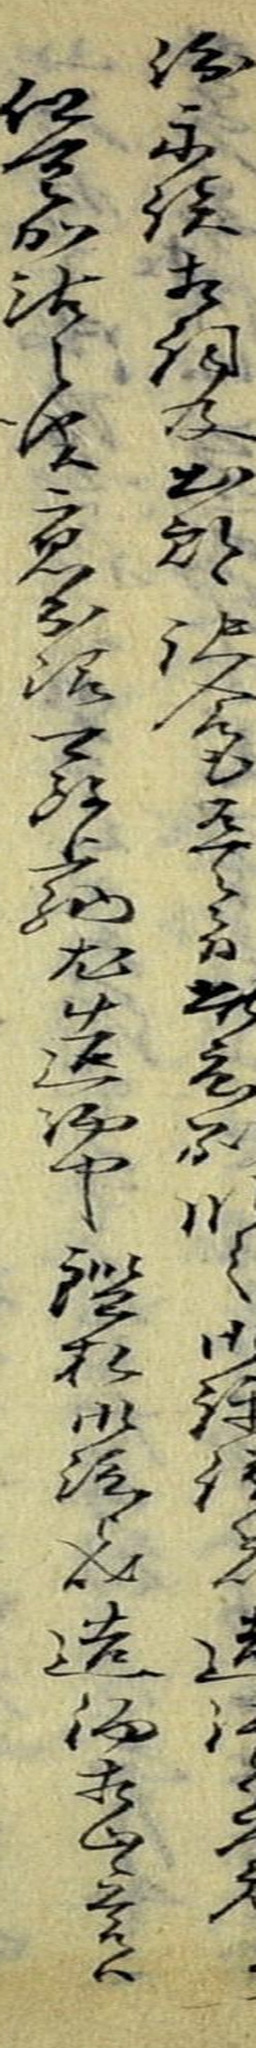但冥加銀之儀は応分銀可致上納尤造酒中鑑札御渡被成造酒相止候節は
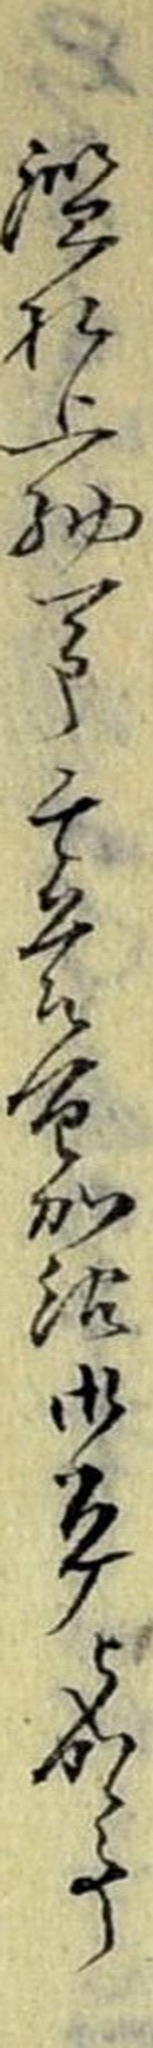鑑札上納可申其節冥加銀御下ヶ被成候事
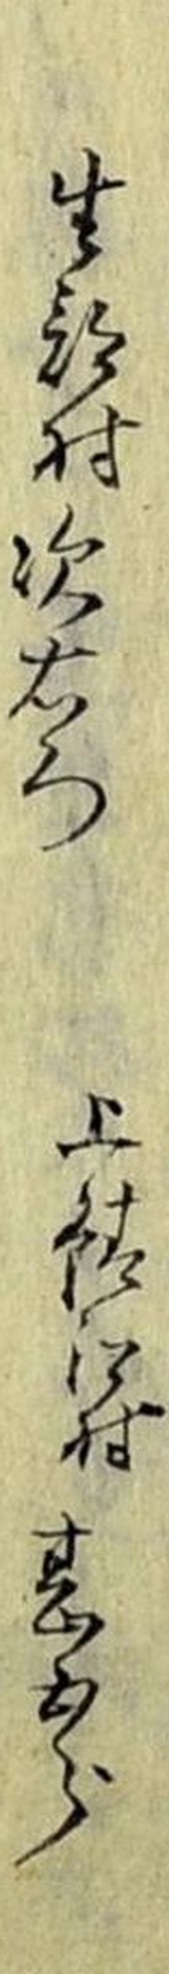生部村次右衛門上鯖江村甚五郎
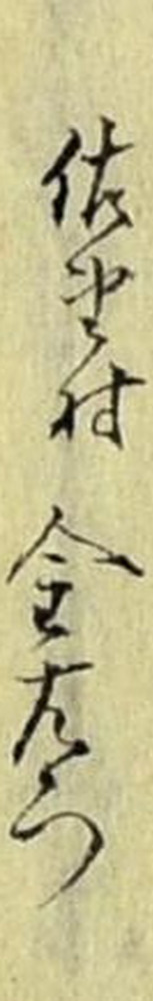佐野村金左衛門

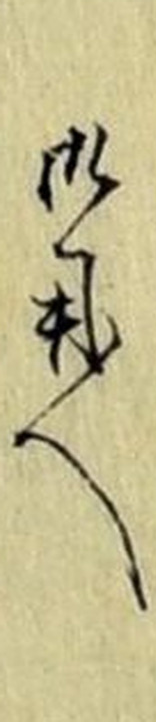御用人
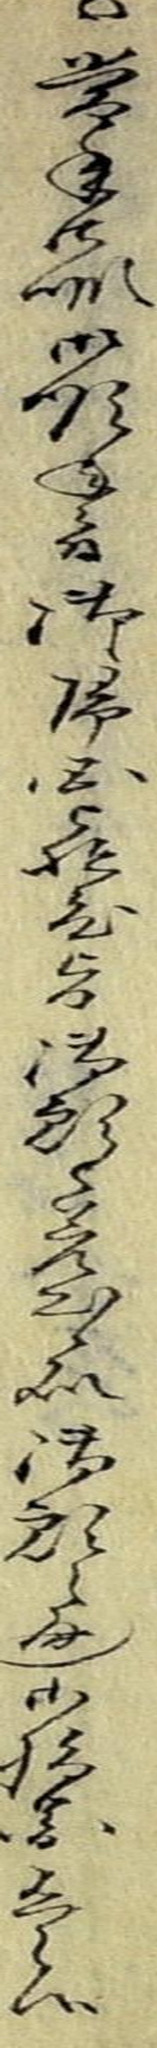○当年御暇御順年に付御帰国被遊度旨御願被差出候処御願之通御指図有之候
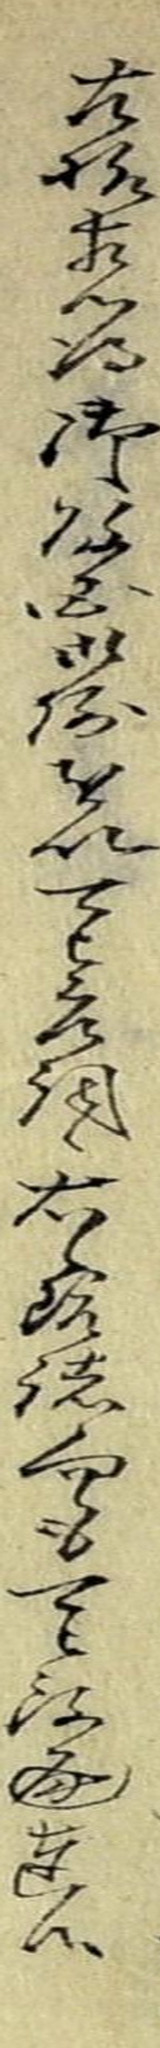左様相心得御帰国御例を以可被取調候右之趣諸向へも可被致通達候
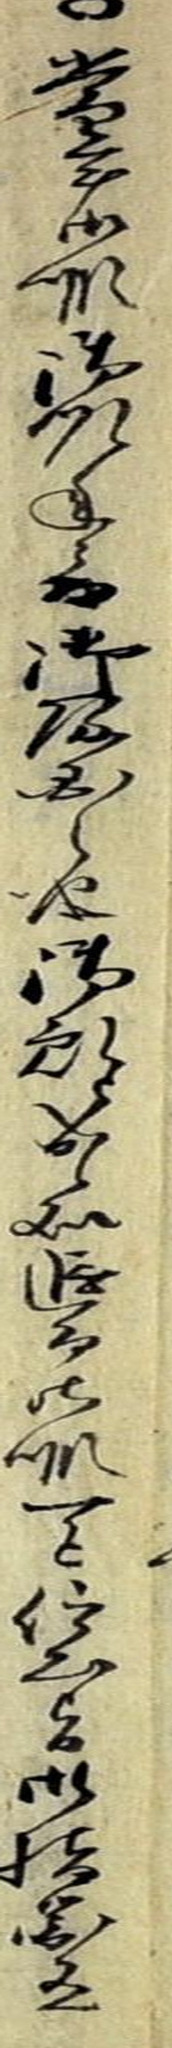○当年御暇御順年に而御帰国之儀御願被成候処追而御暇可被仰出旨御指図有
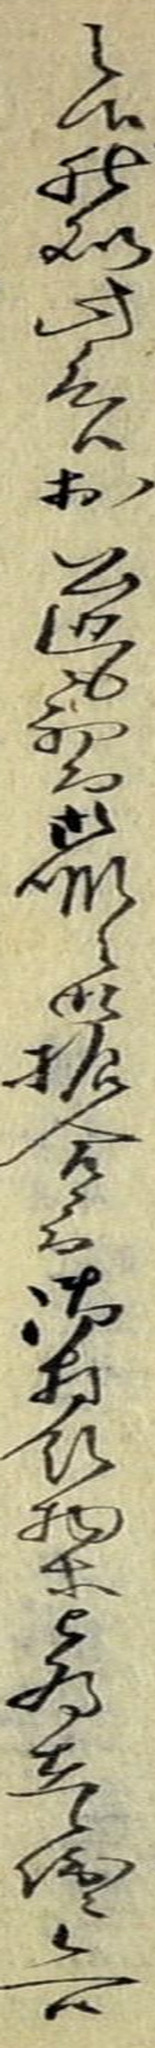之候然処此度は於公辺も初而御暇之御振合に而御拝領物等被為在候儀に候へは
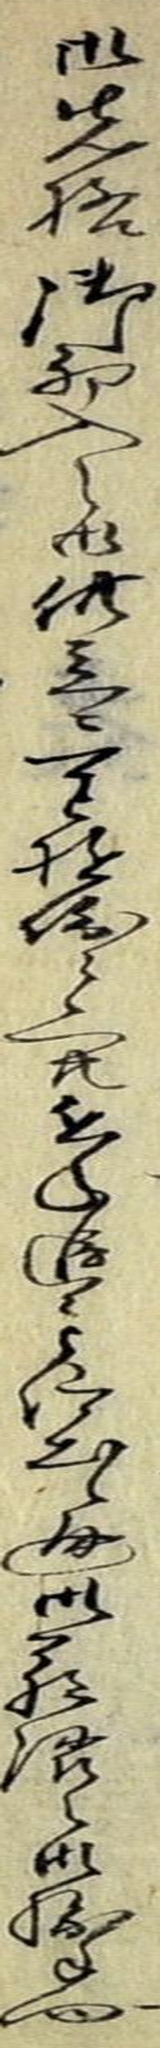御先格御初入之御供立に可被遊儀に候へ共近年追々被仰出候通御難渋之御勝手向
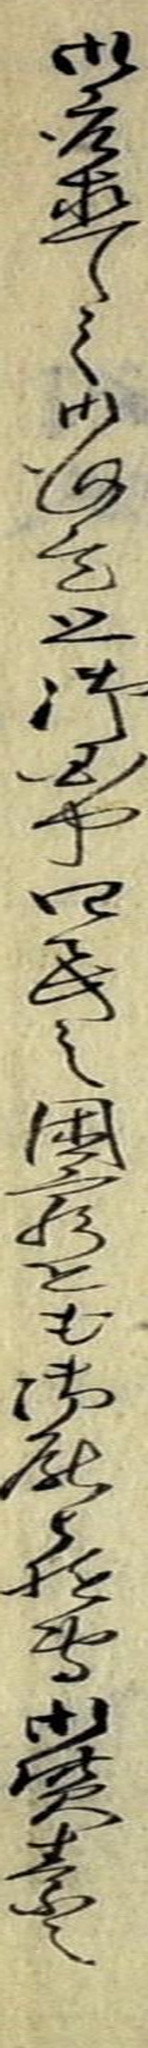御取直し之御趣意且御国中四民之困窮をも御聴被遊専御質素之
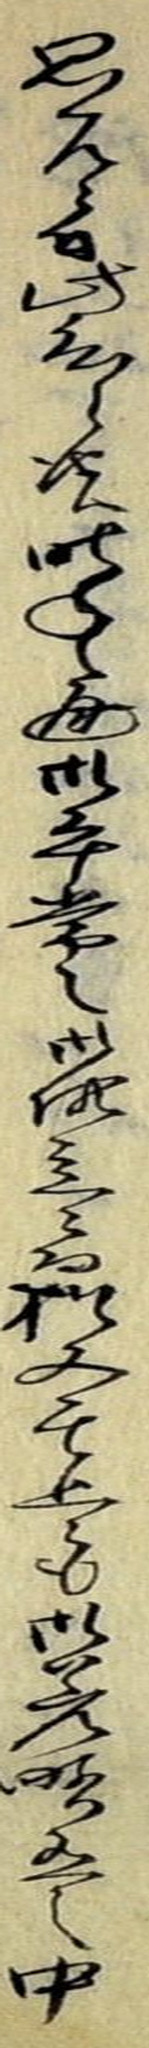思召に付此度之儀は昨年之通御平常之御供立に而猶又其上にも御差略有之中
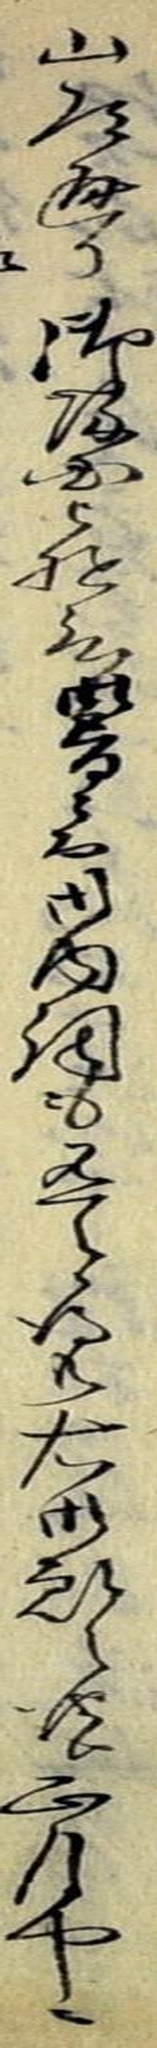山道通り御帰国被遊度御旨に而御内調も有之候得共右御願之儀は正月中に
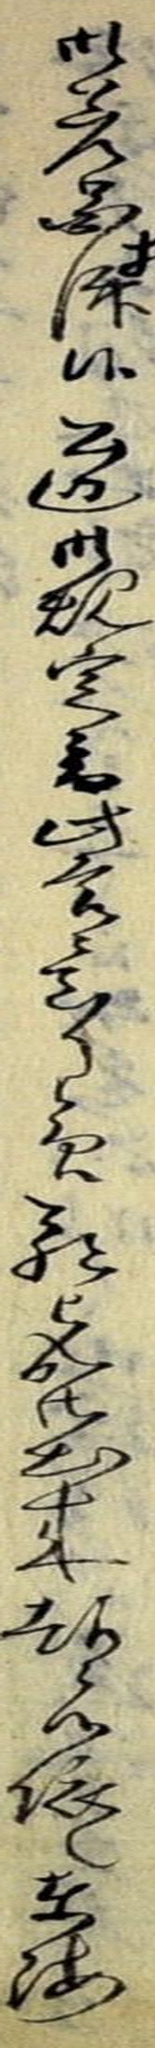御指図相済候公辺御規定に而此節に至り候而は難被成御出来趣に候依之東海
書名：命令之部 六
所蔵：福井県文書館 Fukui Prefectural Archives
